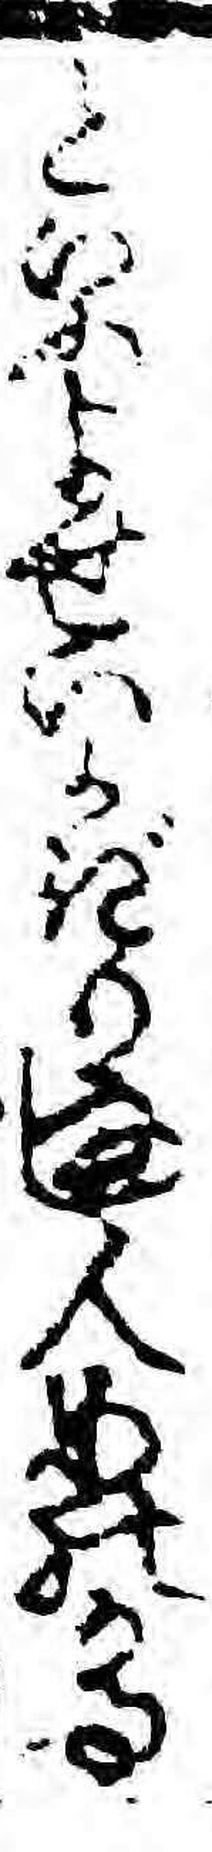といふよせいかぎりなし人めのかる
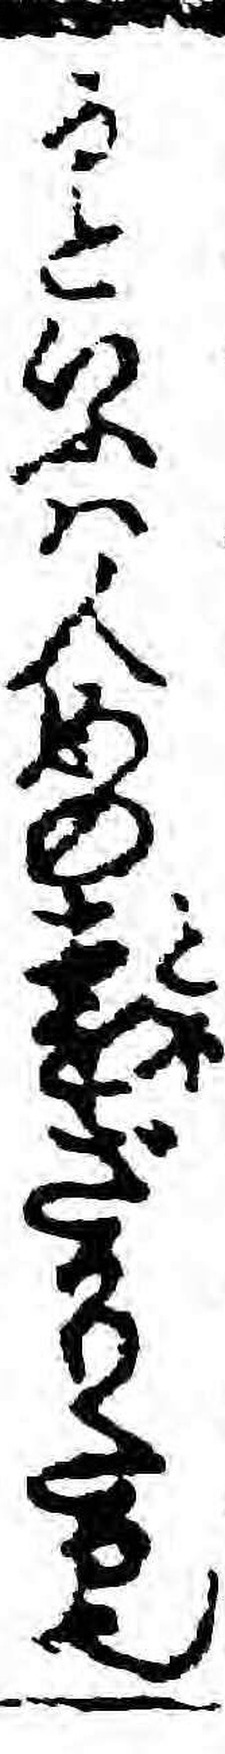るといふは人めの遠ざかりたる也
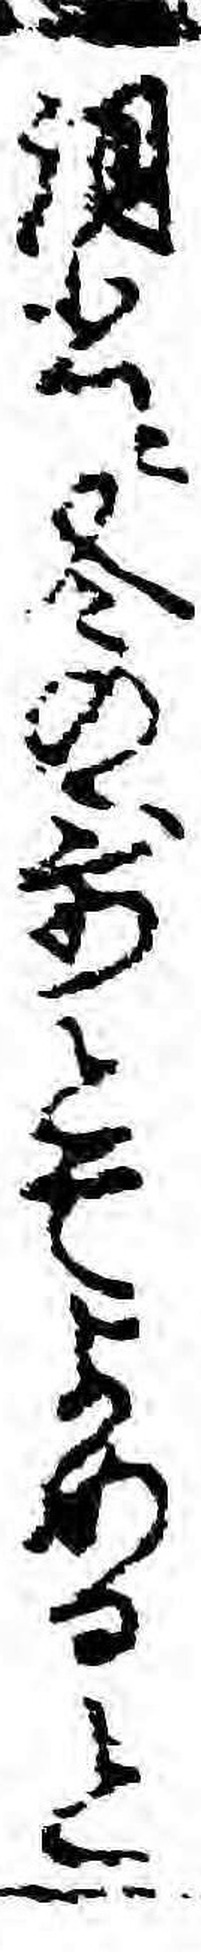詞書に冬の哥とてよめると
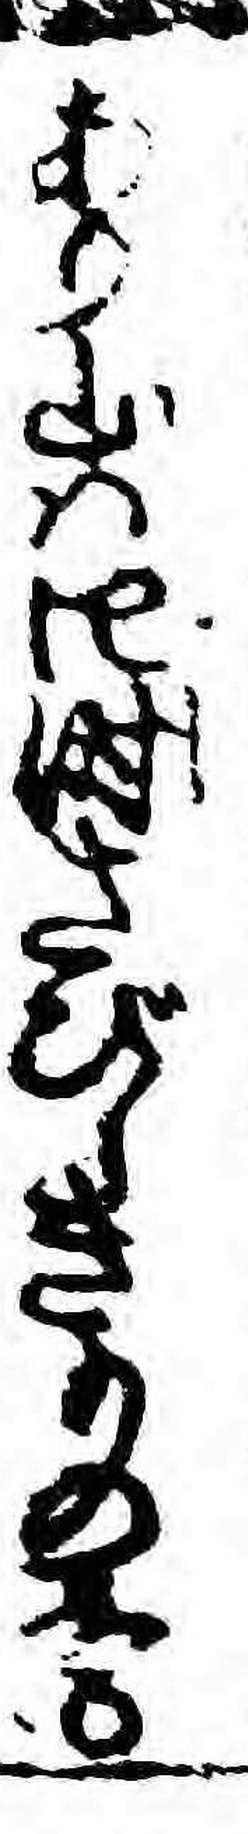あり山は四時さびしきものなり
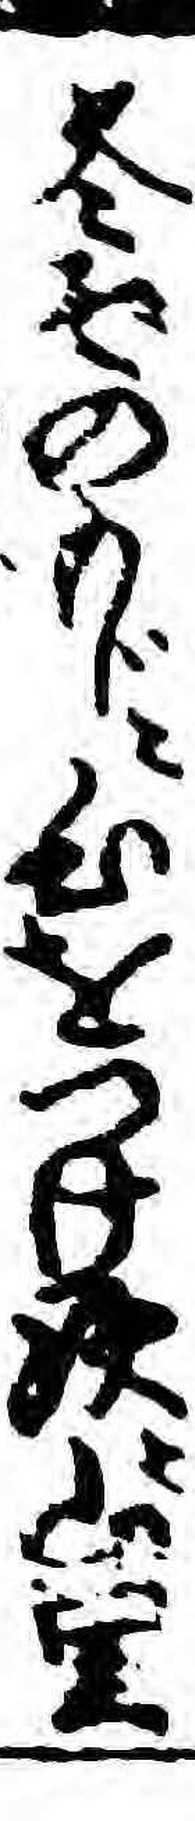冬ぞのもじに心をつけ次に山里
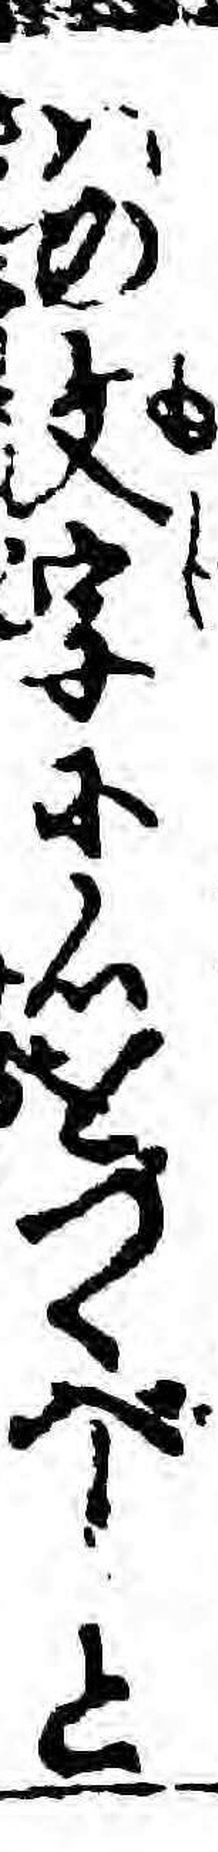はの文字に心をつくべしと
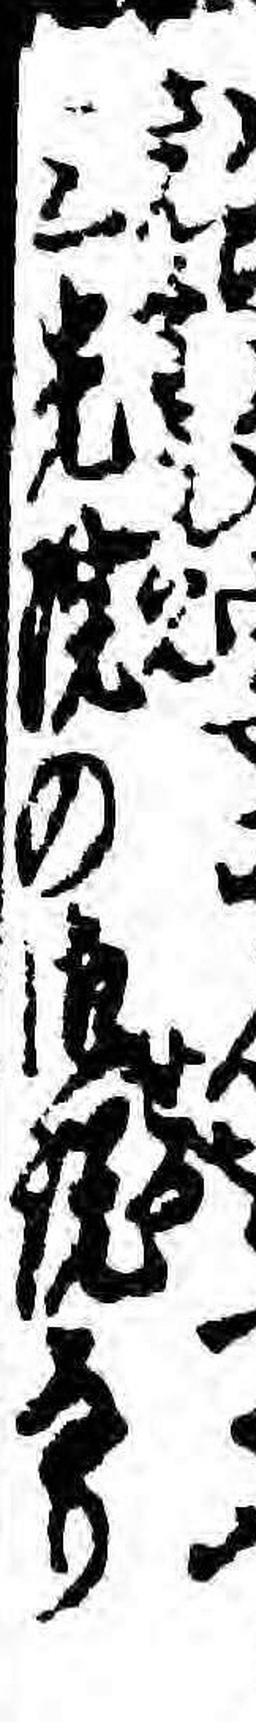三光院の御説なり
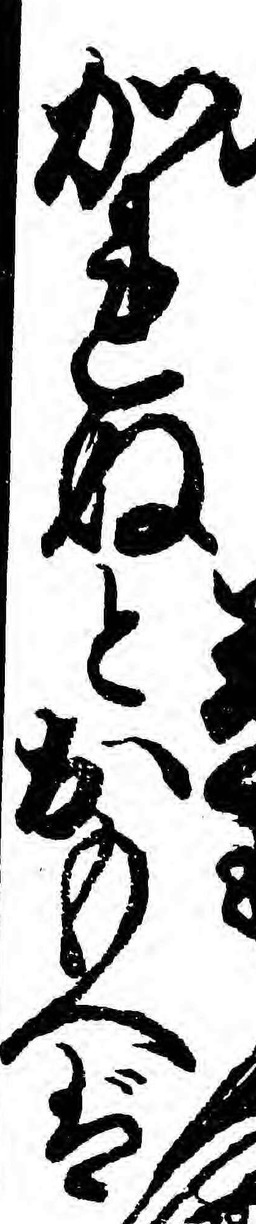かれぬとおもへば
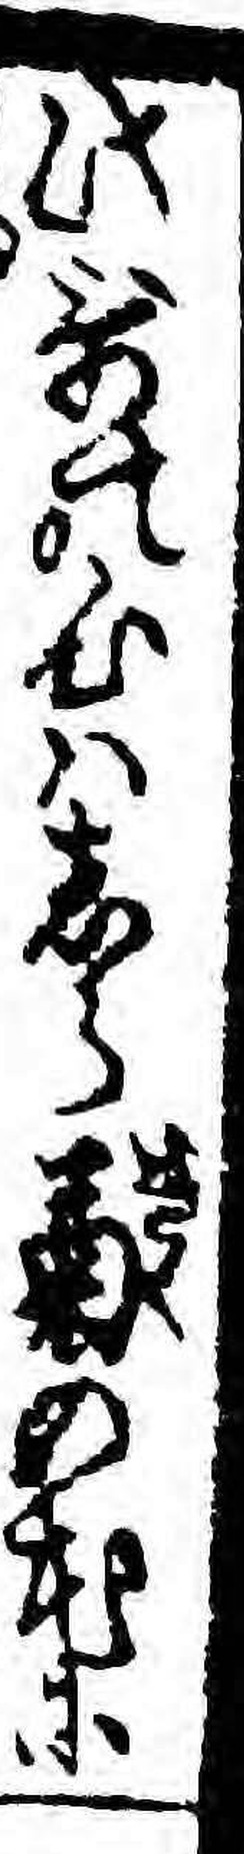此哥の心はしら菊の花に
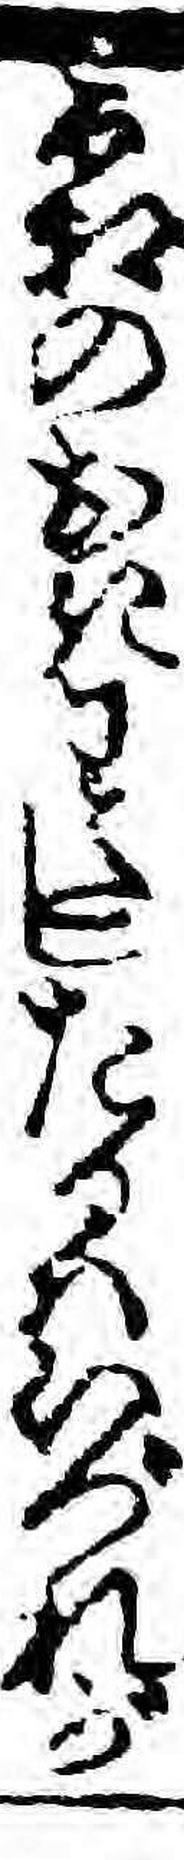霜のおきわたしたるはいづれが
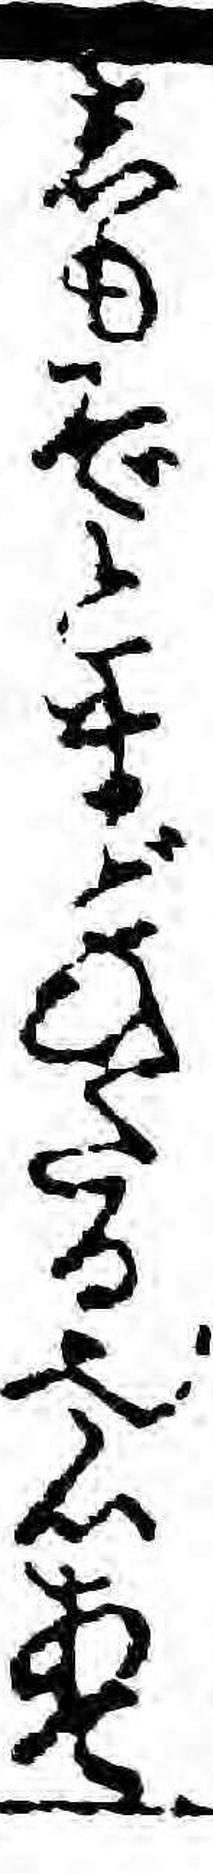しもぞとまどひたる也心あて
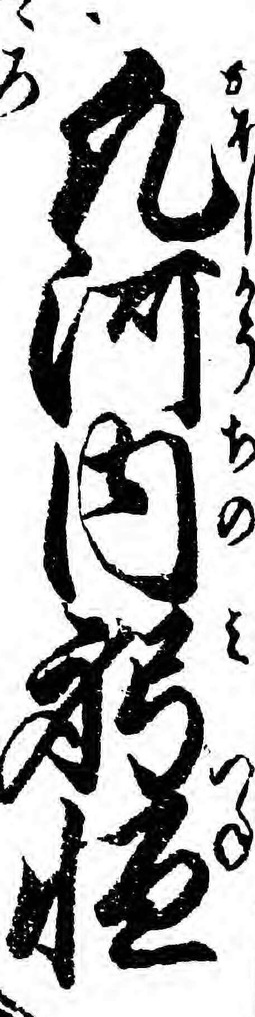凡河内躬恒
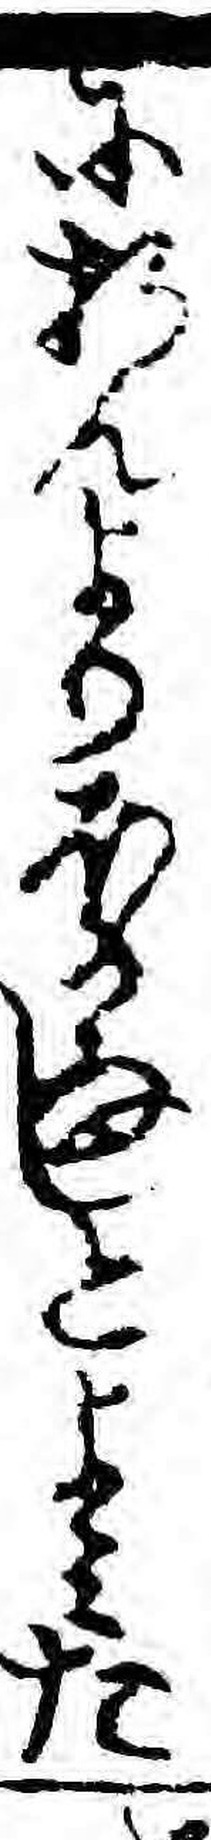に折んよりほかなしとよみた
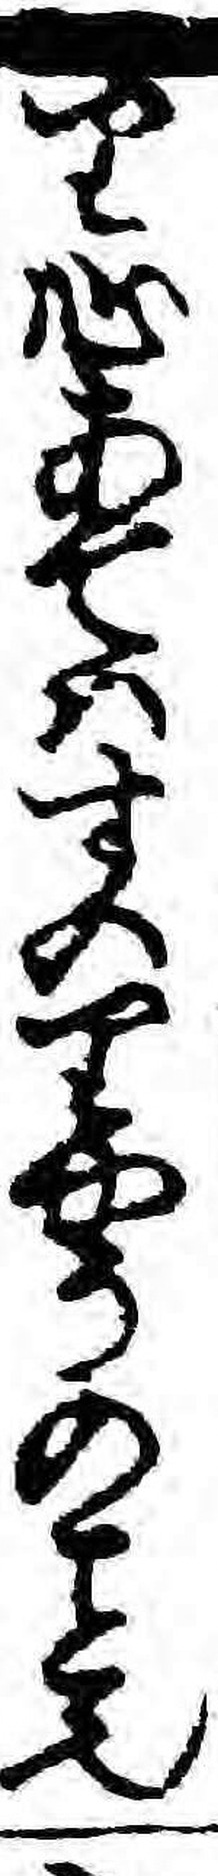り心あてはすいりやうのこと也
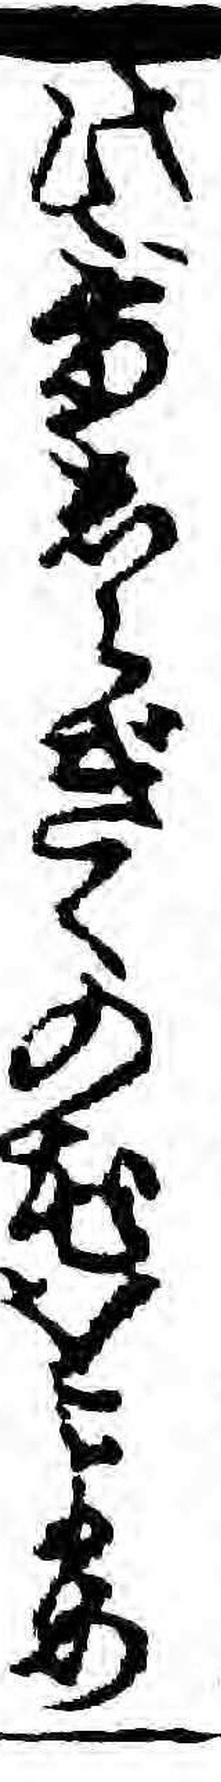此哥しらぎくの花をよめ
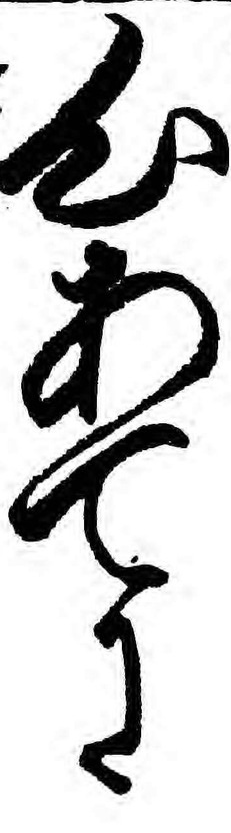心あてに
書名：頭書和歌注譯／壽賀多百人一首小倉錦
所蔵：国文学研究資料館
